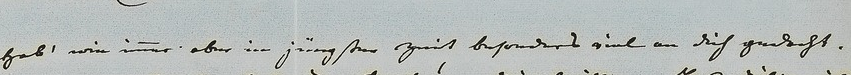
Hab' wie immer aber in jüngster Zeit besonders viel an dich gedacht.
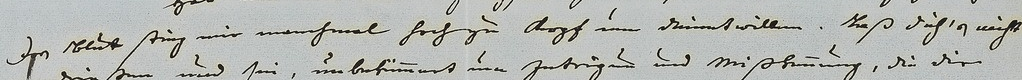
Das Blut stieg mir manchmal hoch zu Kopf um deinetwillen. Laß dich's nicht
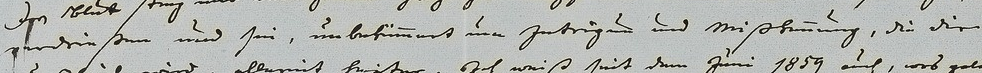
verdrießen und sei, unbekümmert um Intrigen und Mißkennung, die dir
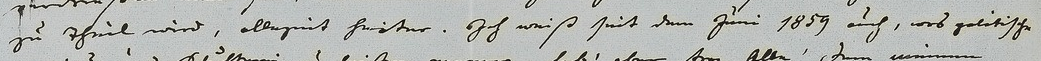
zu Theil wird, allezeit heiter. Ich weiß seit dem Juni 1859 auch, was politische
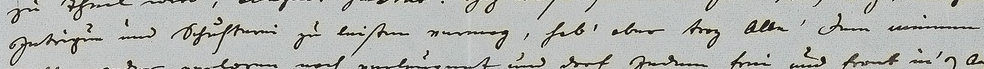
Intrigue und Schufterei zu leisten vermag, hab' aber troz Alle'Dem meinen
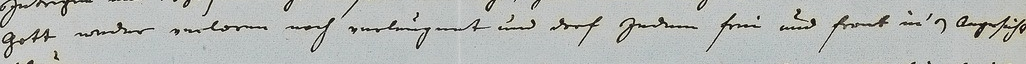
Gott weder verloren noch verleugnet und darf Jedem frei und frank in's Angesicht
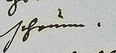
schauen.
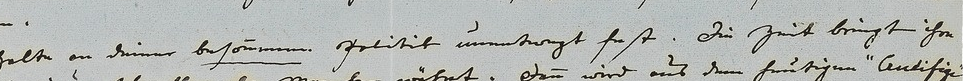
Halte an deiner besonnenen Politik unentwegt fest. Die Zeit bringt ihre
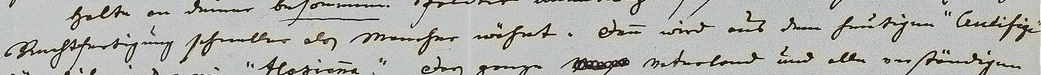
Rechtfertigung schneller als Mancher währt. Dann wird aus dem heutigen «Crucifige»
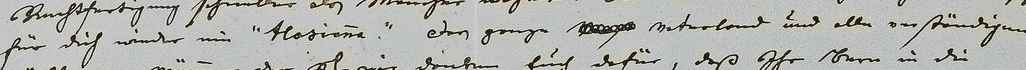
für dich wieder ein «Hosianna». Das ganze ... Vaterland und alle verständigen
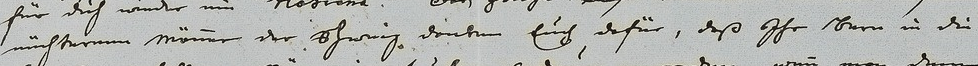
nüchternen Männer der Schweiz danken Euch dafür, daß Ihr Bern in die
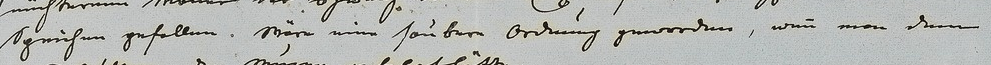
Speichen gefallen. Wäre eine saubere Ordnung geworden, wenn man dem
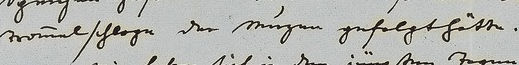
Trommelschlage der Muzen gefolgt hätte.
